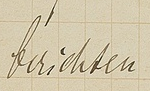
gebundenen
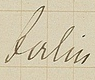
allen
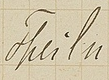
Berlin,
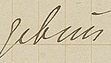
Theilnahme
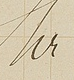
23.
